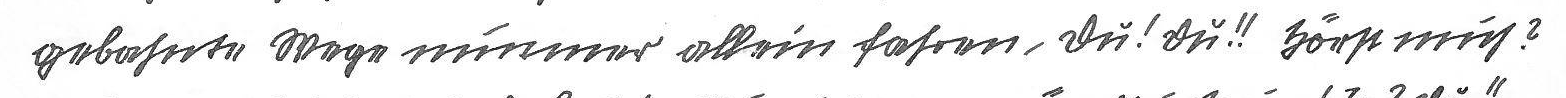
gebahnte Wege nimmer allein fahren, Du! Du!! Hörst mich?
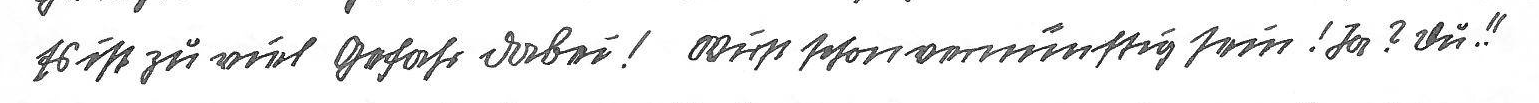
Es ist zu viel Gefahr dabei! Wirst schon vernünftig sein! Ja? Du!!
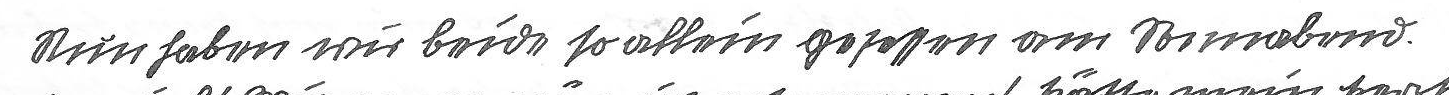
Nun haben wir beide so allein gesessen am Sonnabend.
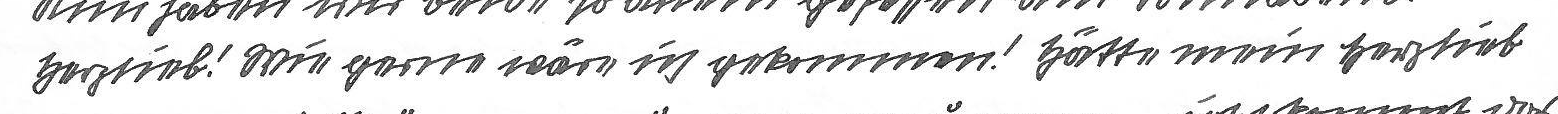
Herzlieb! Wie gerne wäre ich gekommen! Hätte mein Herzlieb
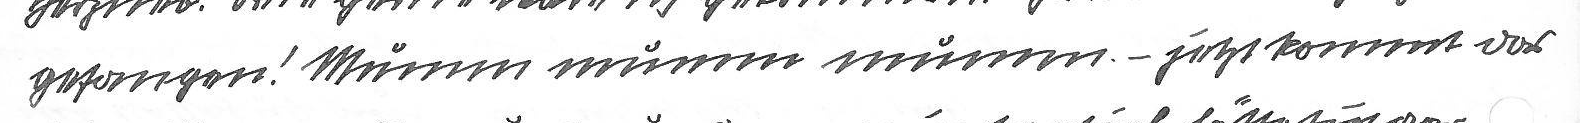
gefangen! Mumm mumm mumm – jetzt kommt das
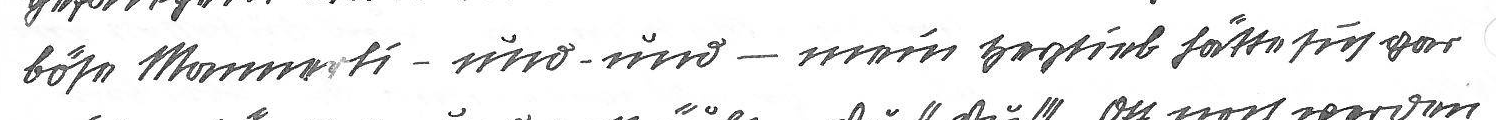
böse Mannerli – und – und – mein Herzlieb hätte sich gar
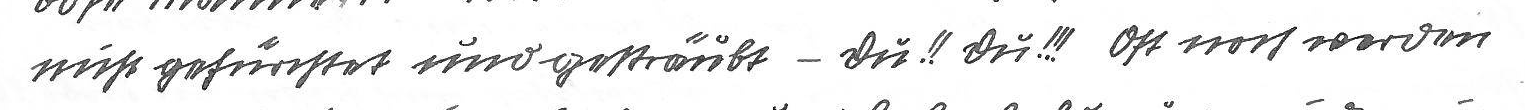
nicht gefürchtet und gesträubt – Du!! Du!!! Oft noch werden
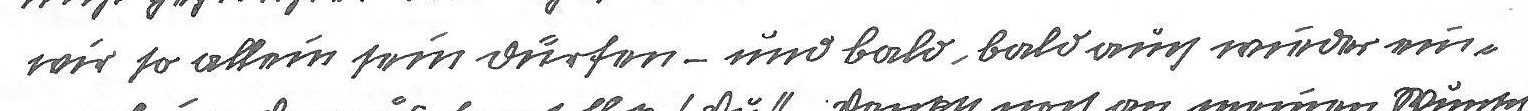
wir so allein sein dürfen – und bald, bald auch wieder ein¬
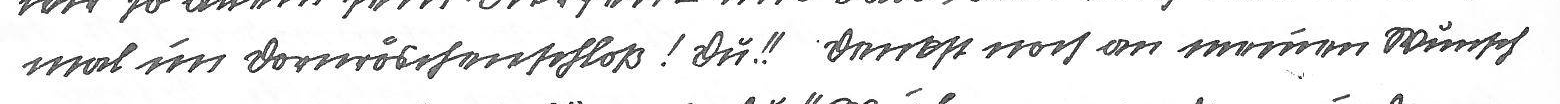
mal im Dornröschenschloss! Du!! Denkst noch an meinen Wunsch
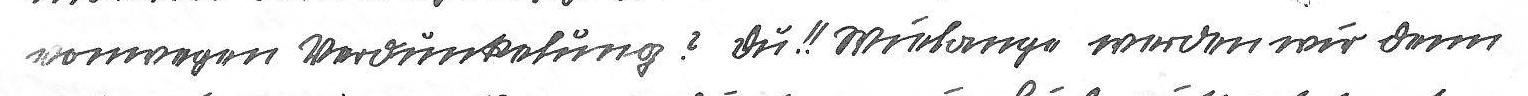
von wegen Verdunkelung? Du!! Wielange werden wir denn
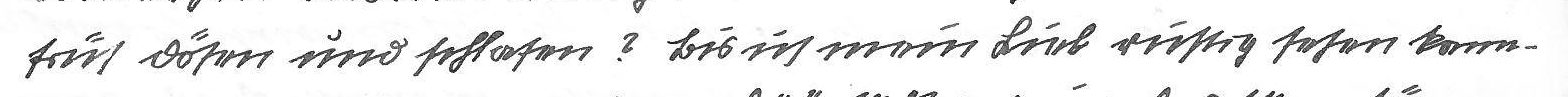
früh dösen und schlafen? Bis ich mein Lieb richtig sehen kann –
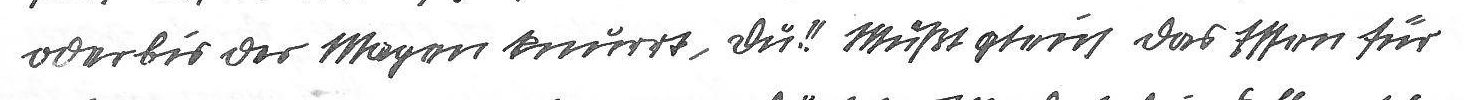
oder bis der Magen knurrt, Du!! Mußt gleich das Essen für
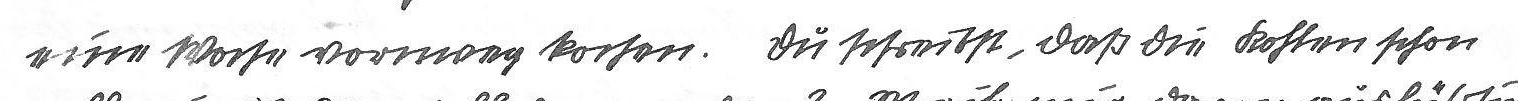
eine Woche vornweg kochen. Du schreibst, daß die Kohlen schon
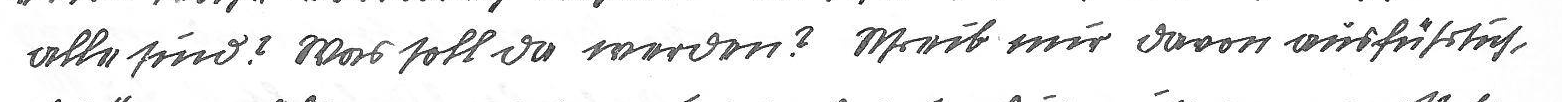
alle sind? Was soll da werden? Schreib mir davon ausführlich,
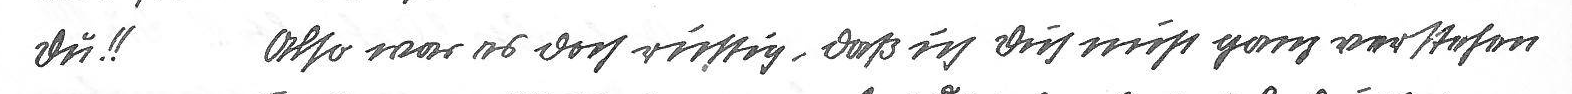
Du!! Also war es doch richtig, daß ich Dich nicht ganz verstehen
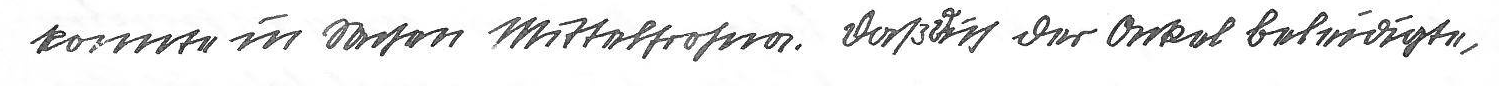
konnte in Sachen M. Daß Dich der Onkel beleidigte,
